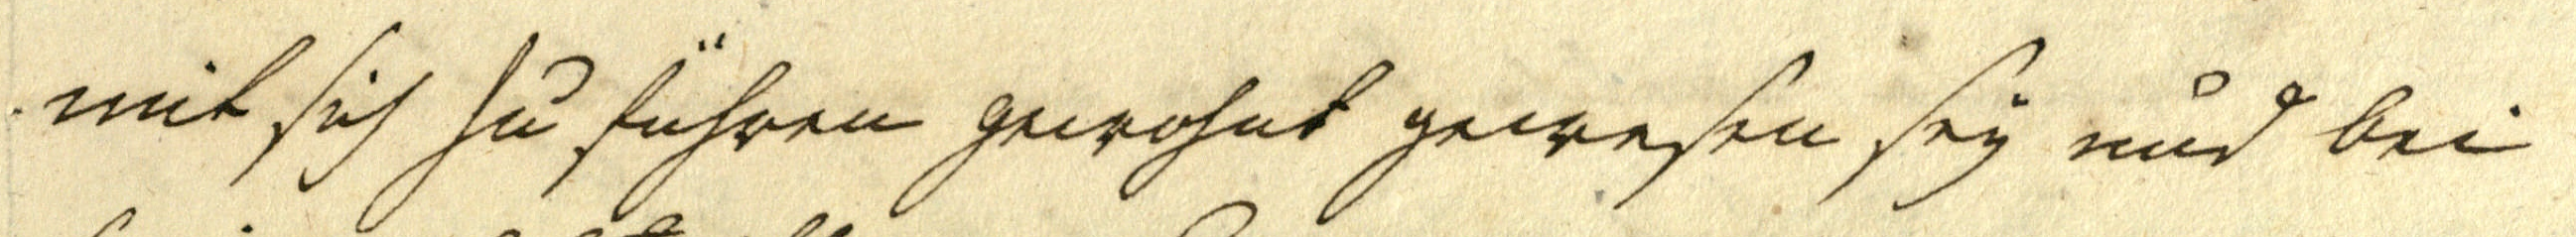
mit sich zu führen gewohnt gewesen seÿ und bei
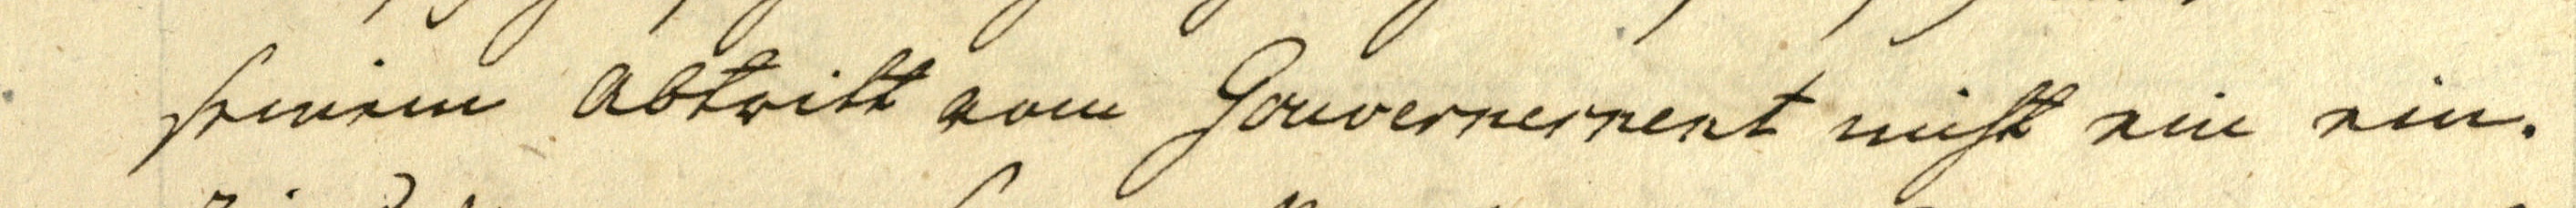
seinem Abtritt vom Gouvernement nicht ein ein¬
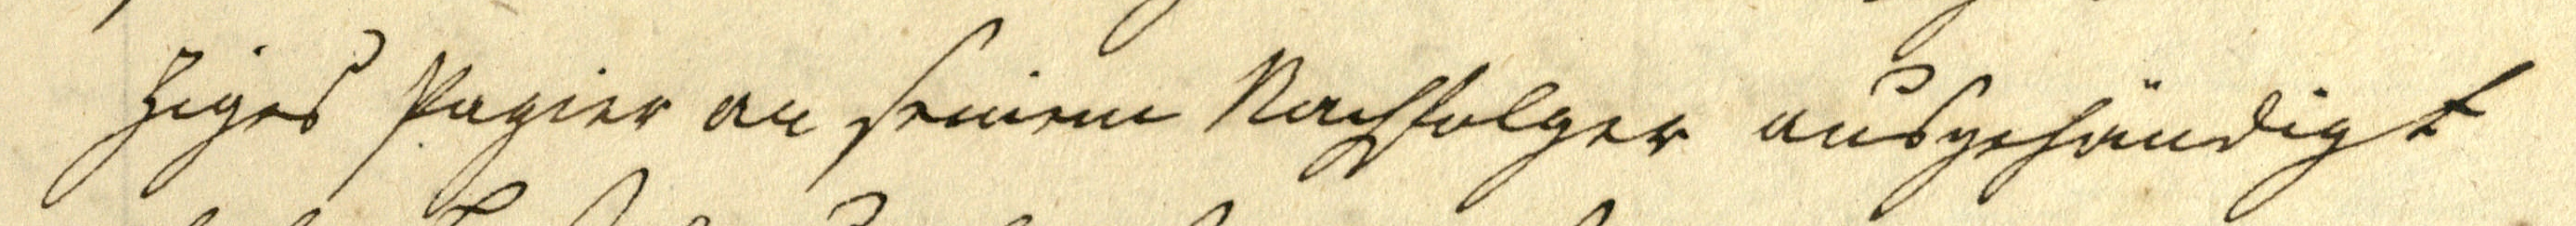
ziges Papier an seinen Nachfolger ausgehändigt
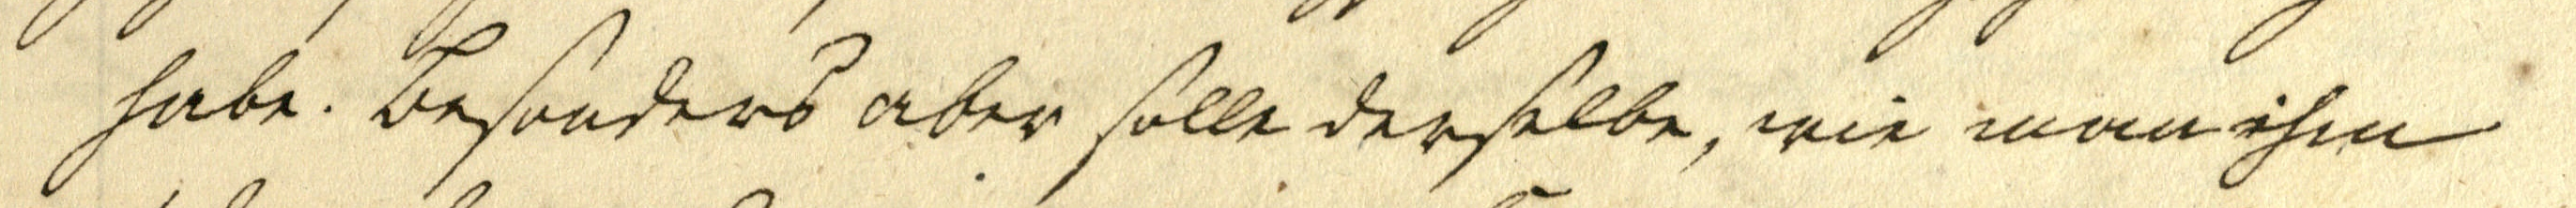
habe. Besonders aber solle derselbe, wie man ihm
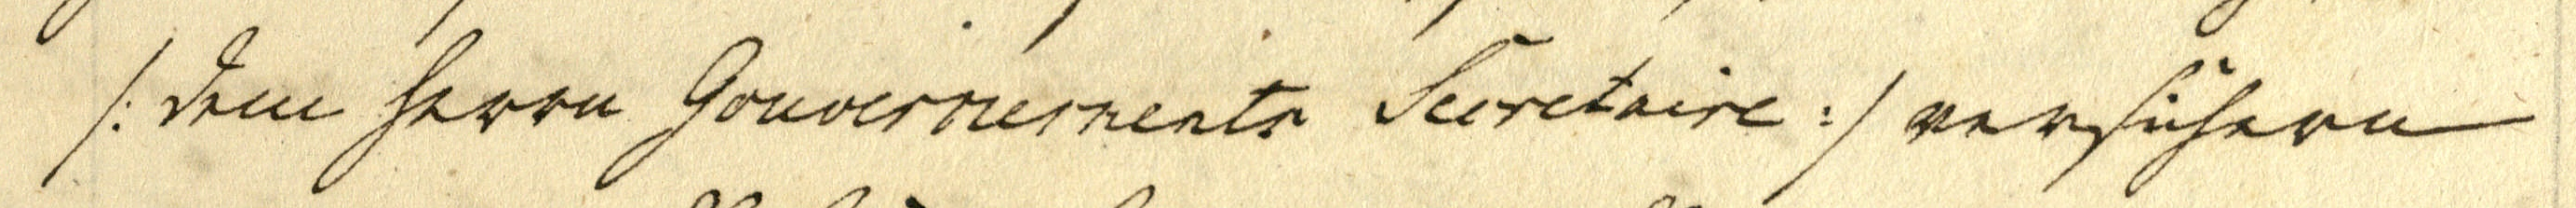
( dem herrn Gouvernements Secretaire) versichern
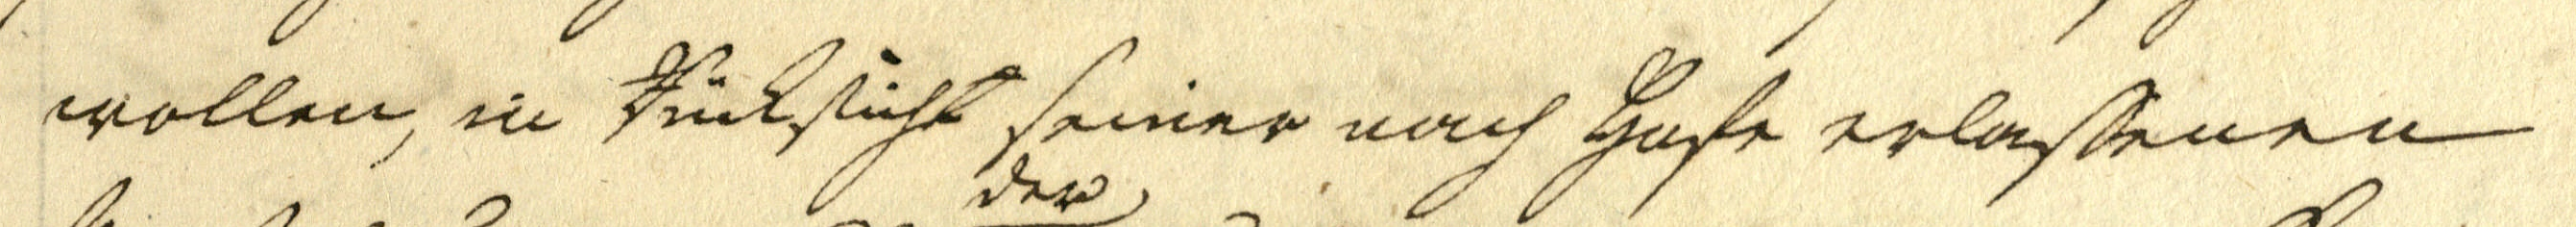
wollen, in Rücksicht seiner nach Hofe erlassenen
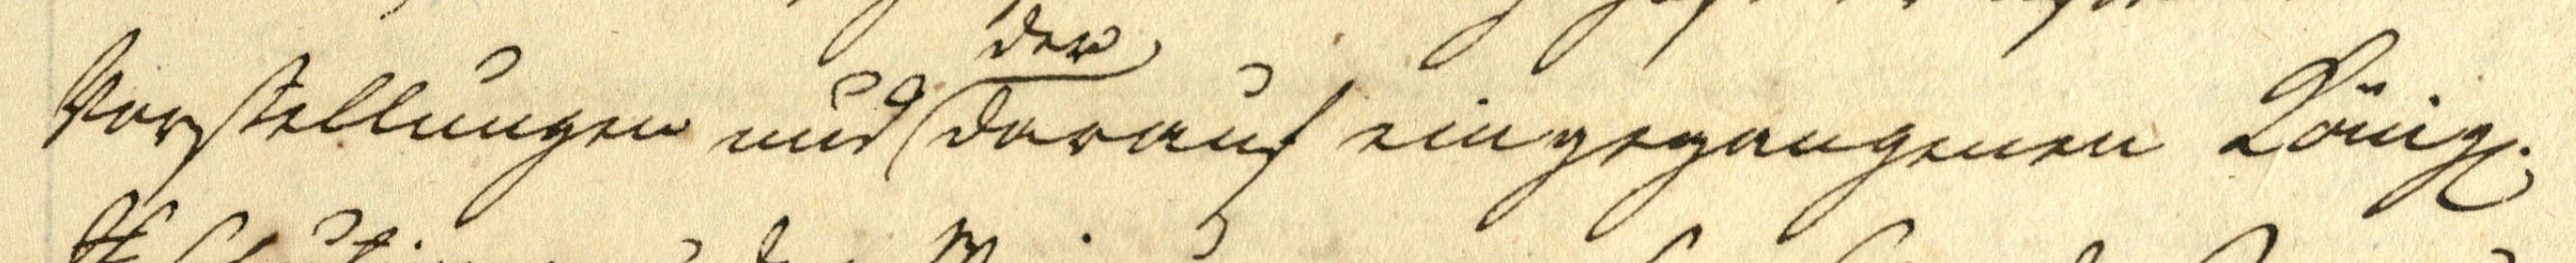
Vorstellungen und der darauf eingegangenen Königl.
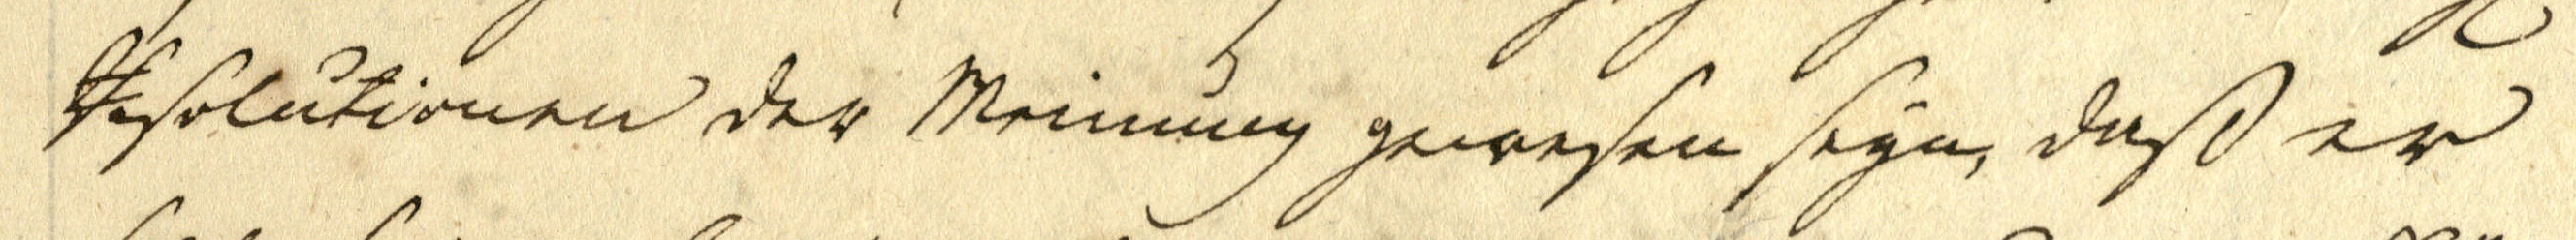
Resolutionen der Meinung gewesen seÿn, daß er
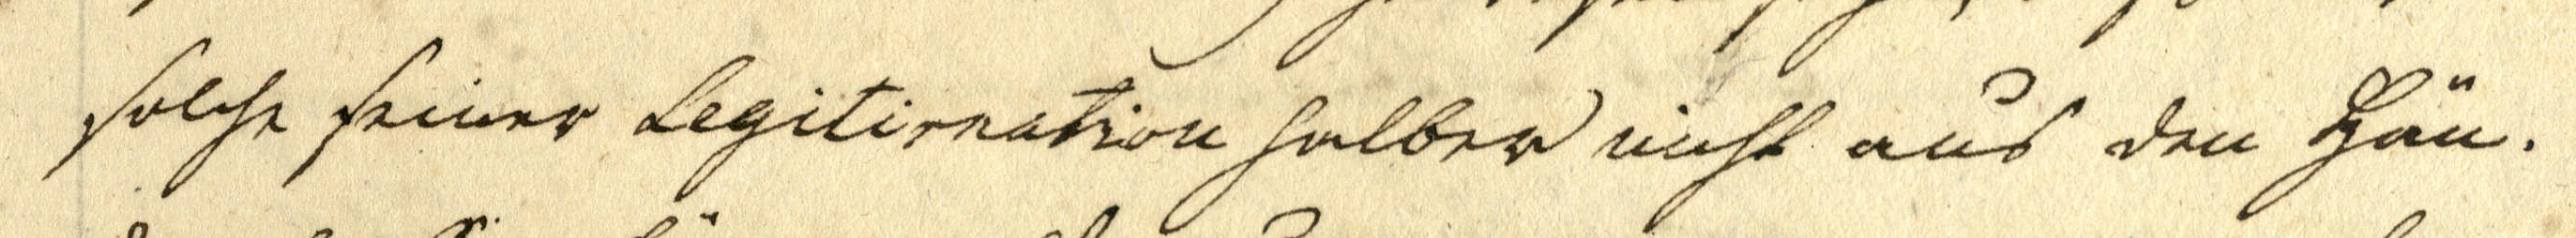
solche seiner Legitimation halber nicht aus den Hän¬
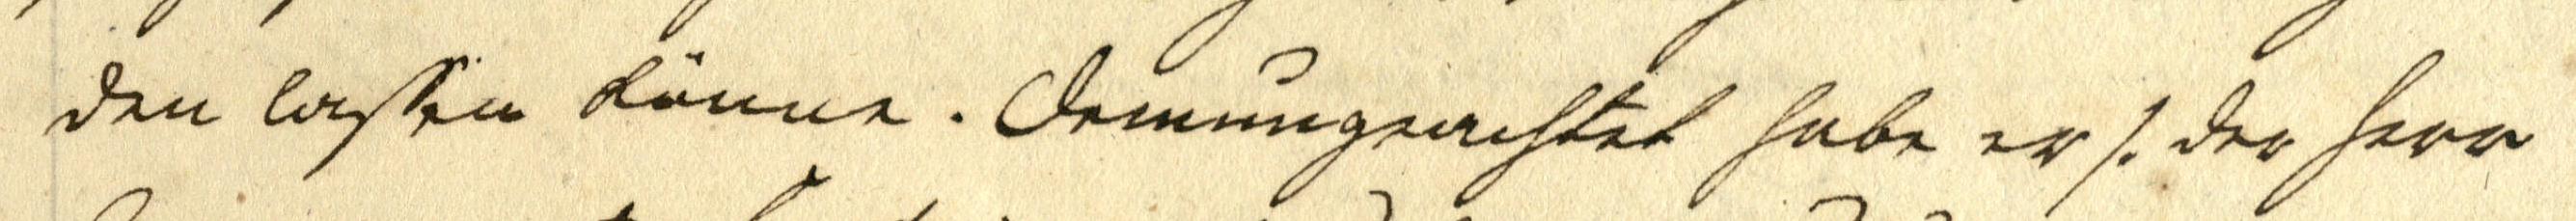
den lassen könne. Demungeachtet habe er (der herr
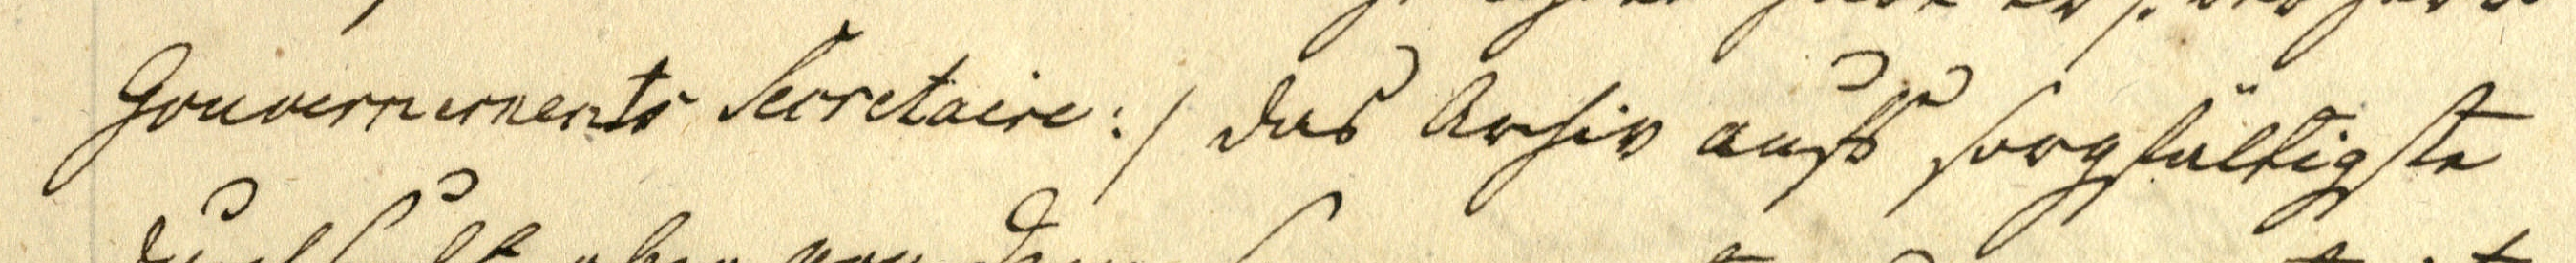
Gouvernements Secretaire) das Archiv aufs sorgfältigste
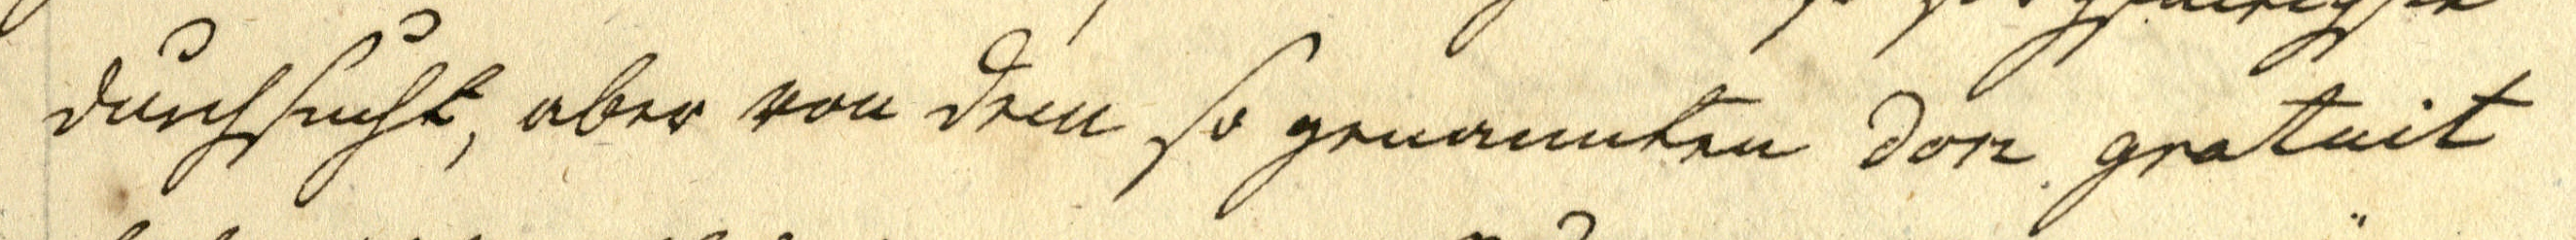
durchsucht, aber von dem so genannten don gratuit
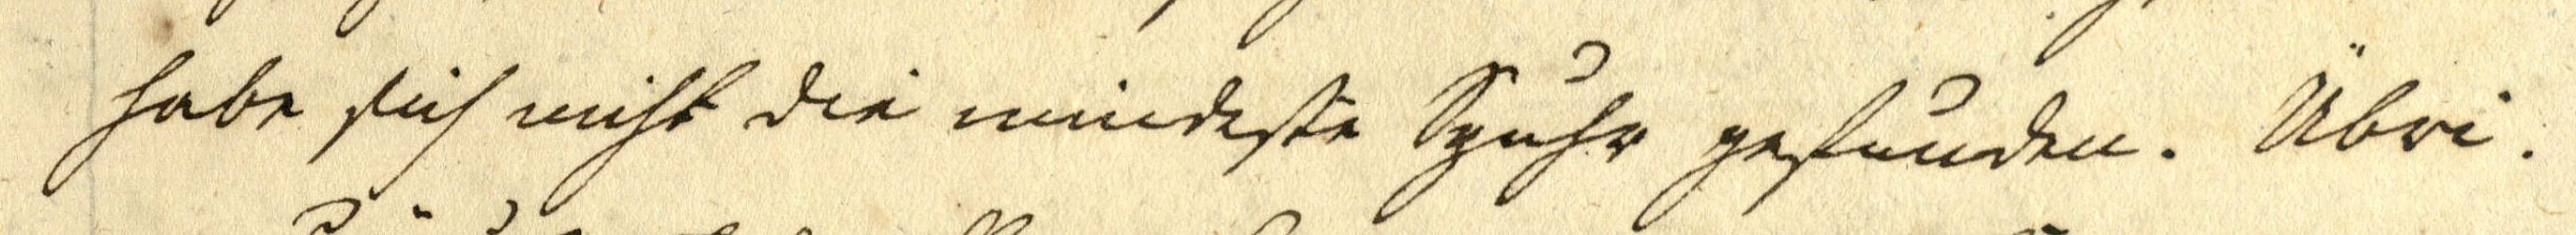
habe sich nicht die mindeste Spuhr gefunden. Übri¬
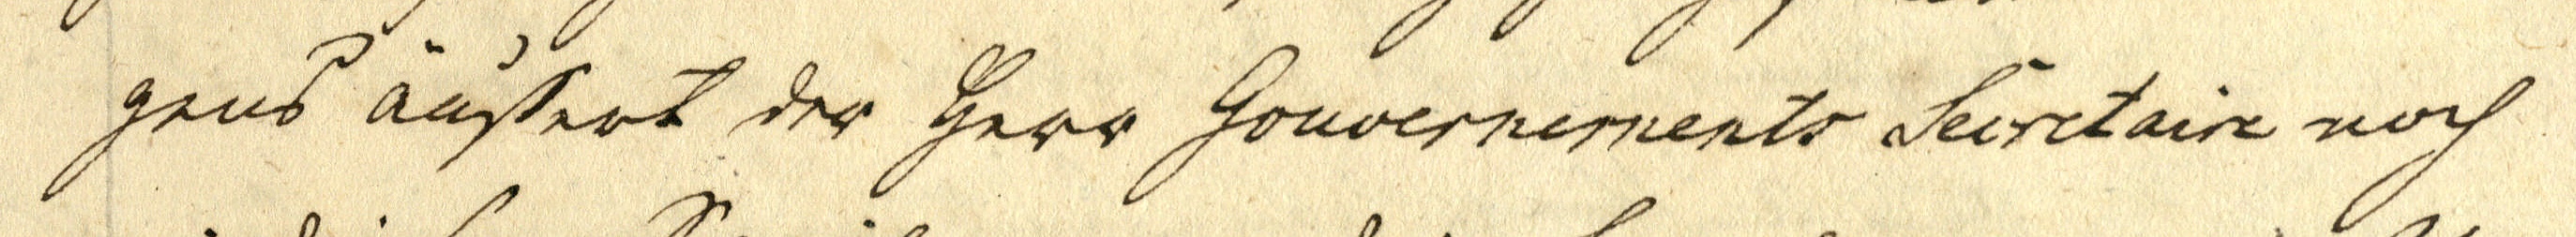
gens äußerte der Herr Gouvernements Secretaire noch
